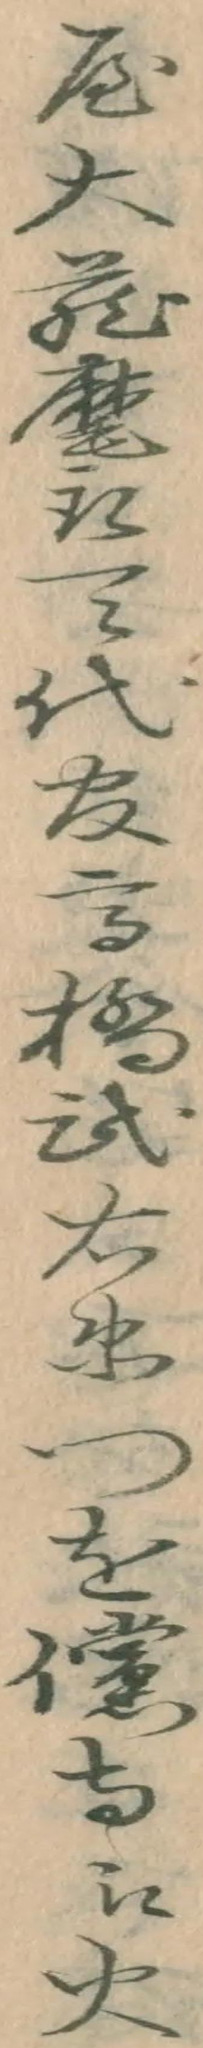屋大蔵麾取て代官高橋武右衛門を儻寺え火

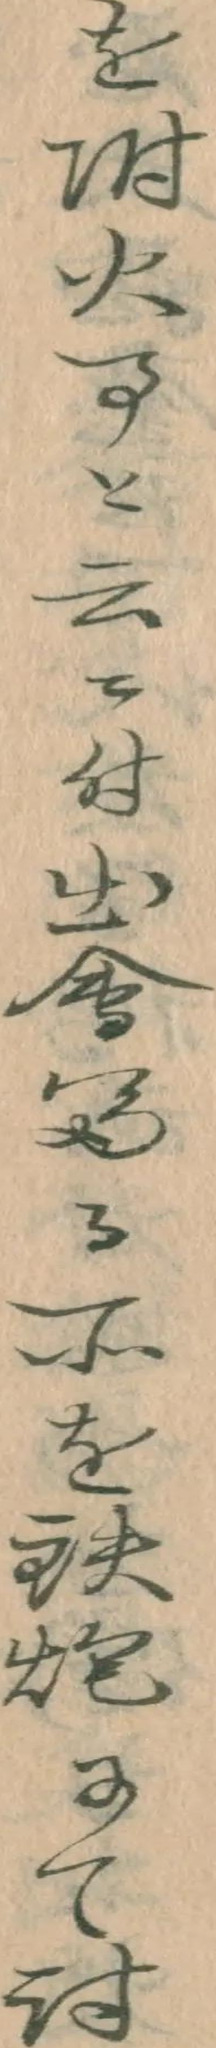を附火事と云に付出会たる所を鉄炮にて討
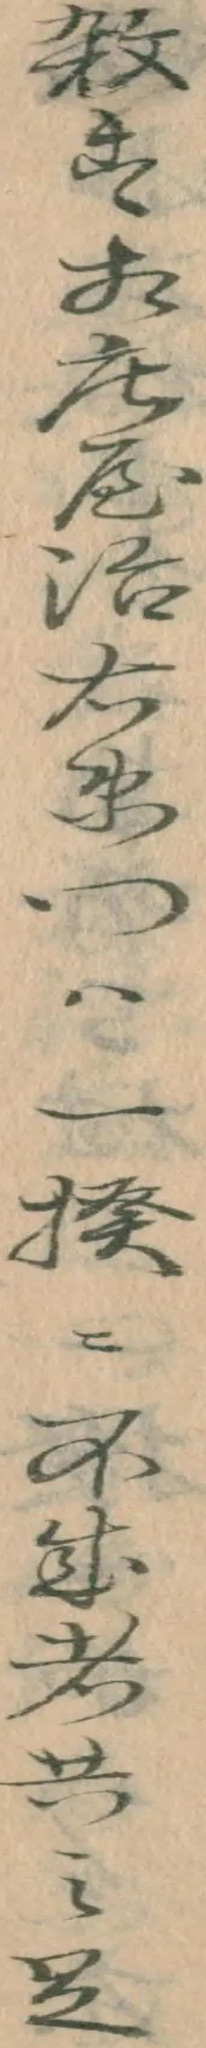殺す相庄屋治右衛門は一揆に不成者共之足
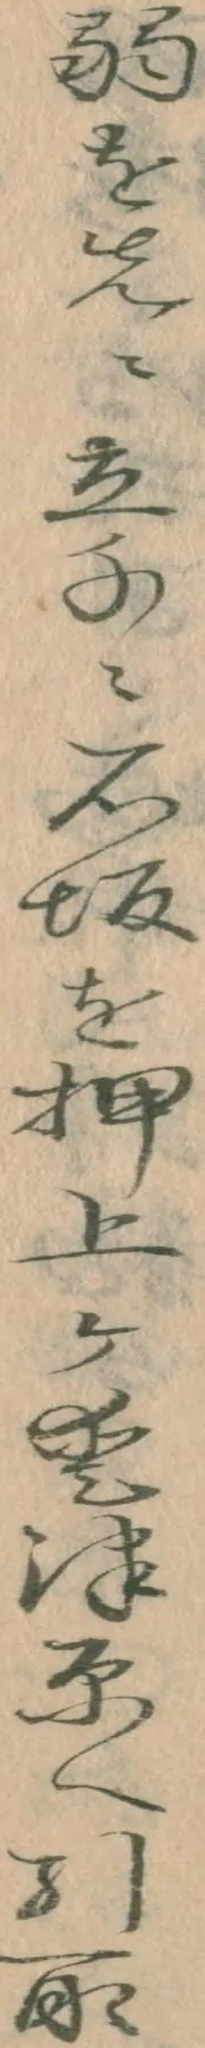弱を先に立千々石坂を押上け豊津原へ引取
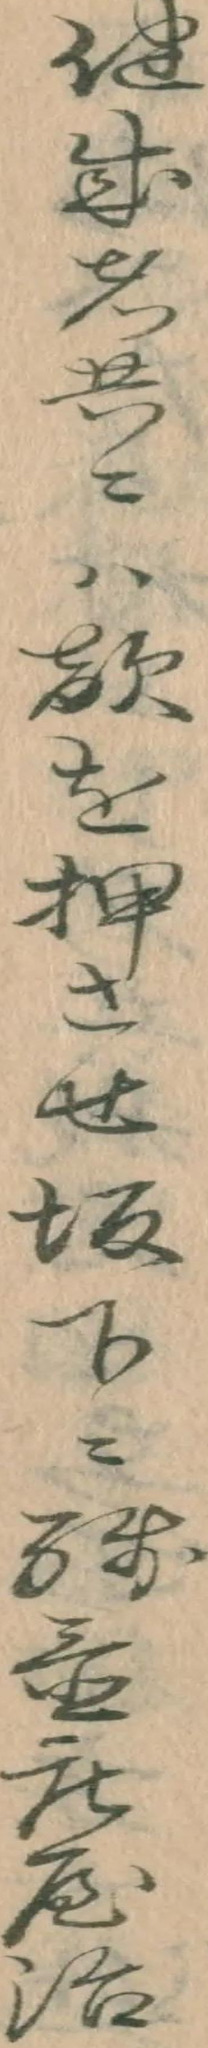健成者共には敵を押させ坂下に残置庄屋治
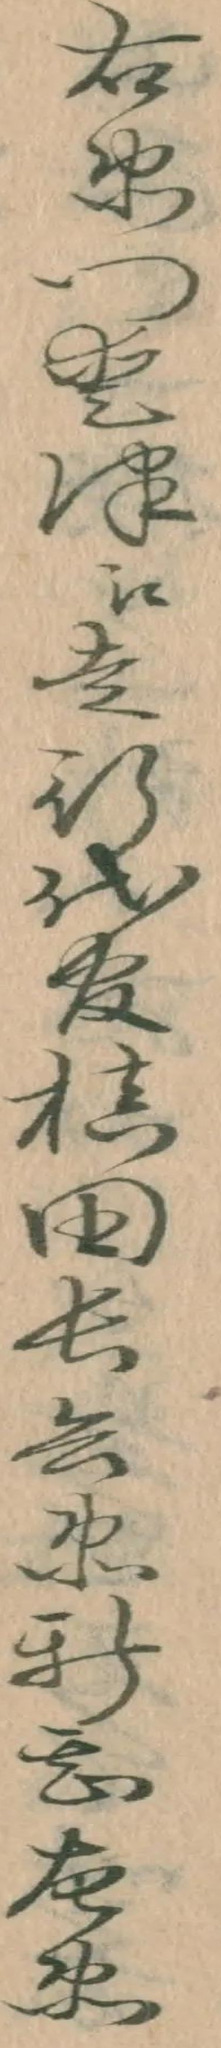右衛門豊津え走行代官槙田長兵衛新甚左衛
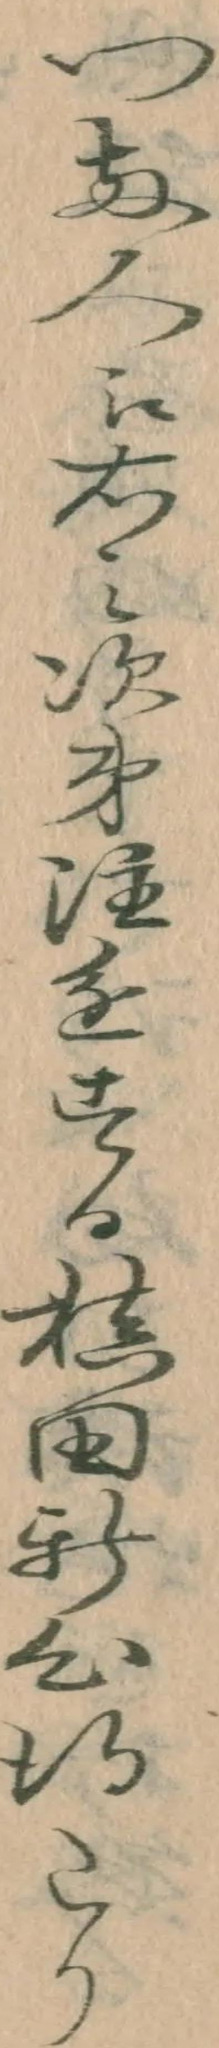門両人え右之次第注進する槙田新心得たり
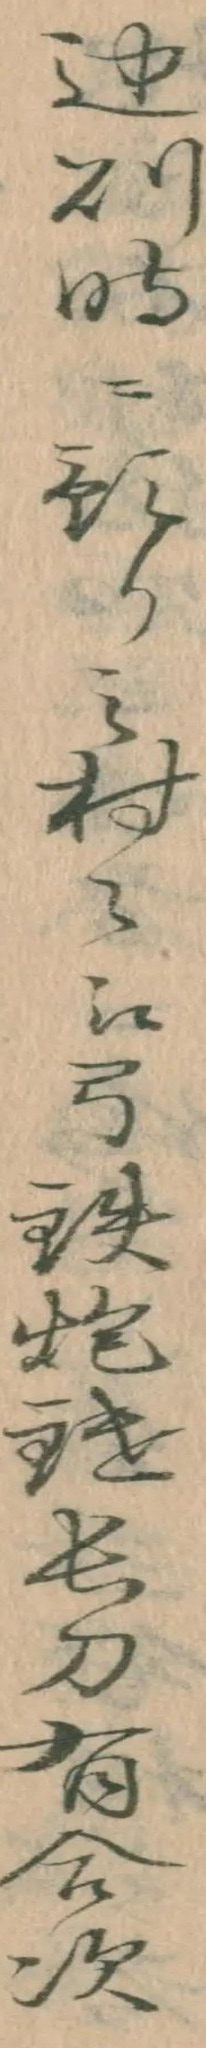迚別時に預り之村々え弓鉄炮鑓長刀有合次
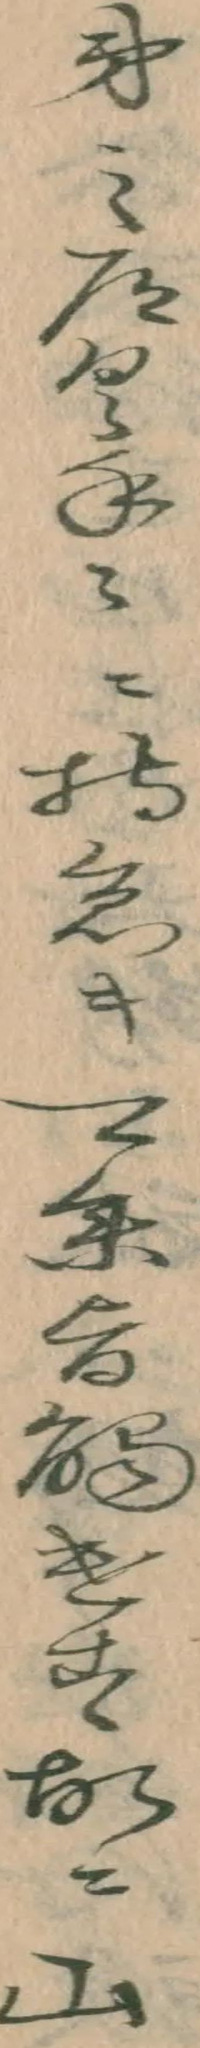第之道具手々に持急き可参旨触遣す故に山
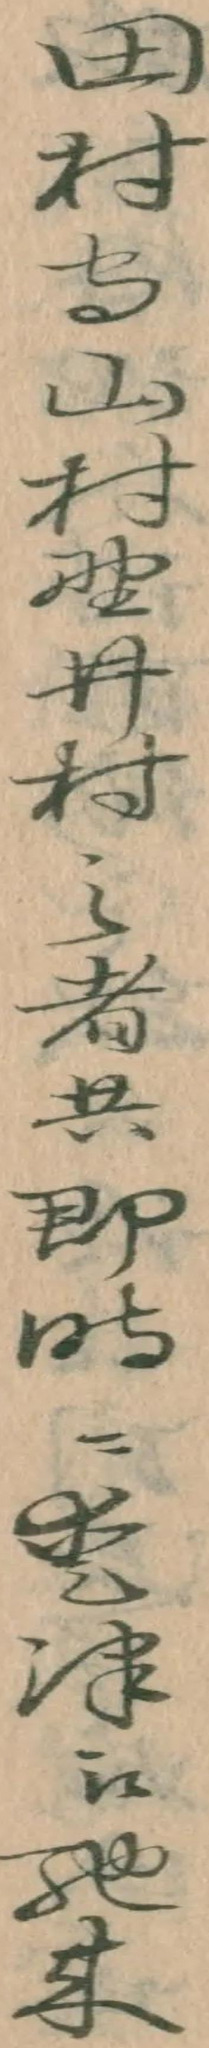田村寺山村野井村之者共即時に豊津え馳来
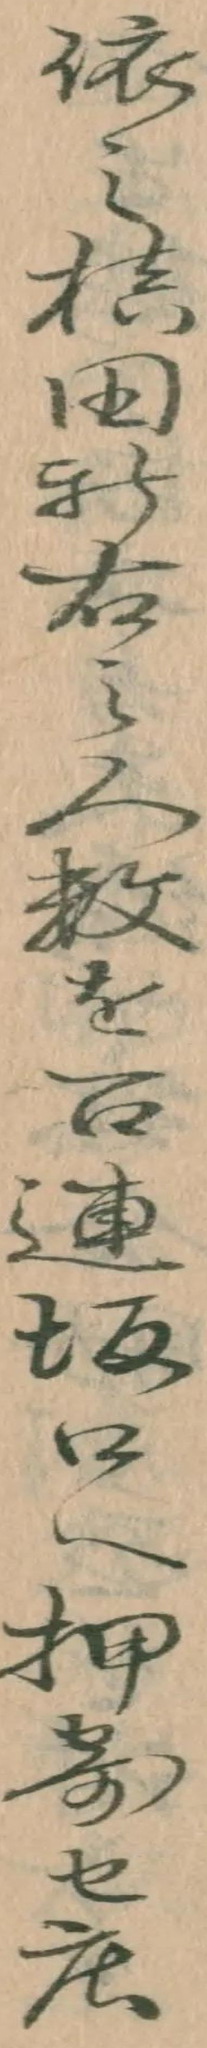依之槙田新右之人数を召連坂口へ押寄せ庄
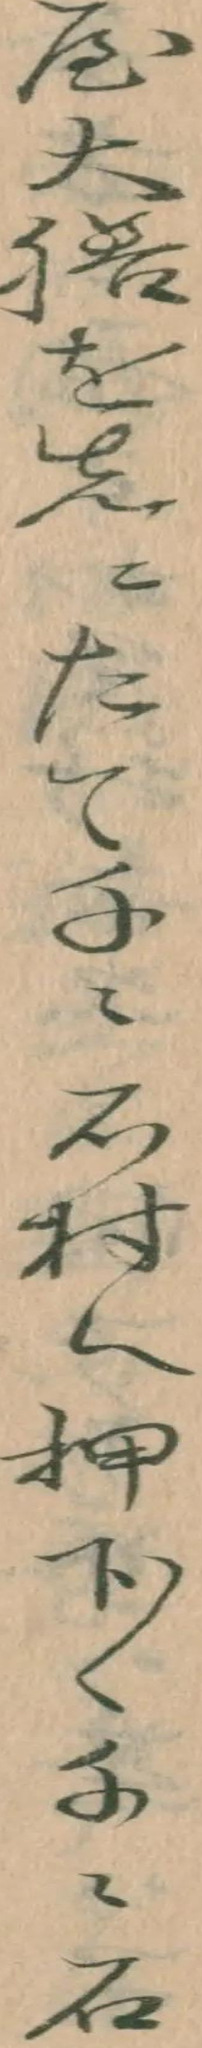屋大膳を先にたて千々石村へ押下候千々石
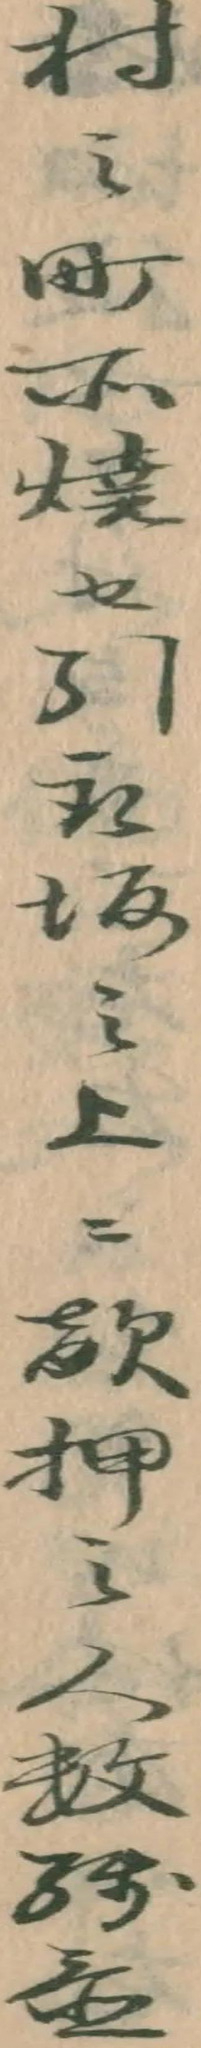村之町所焼せ引取坂之上に敵押之人数残置
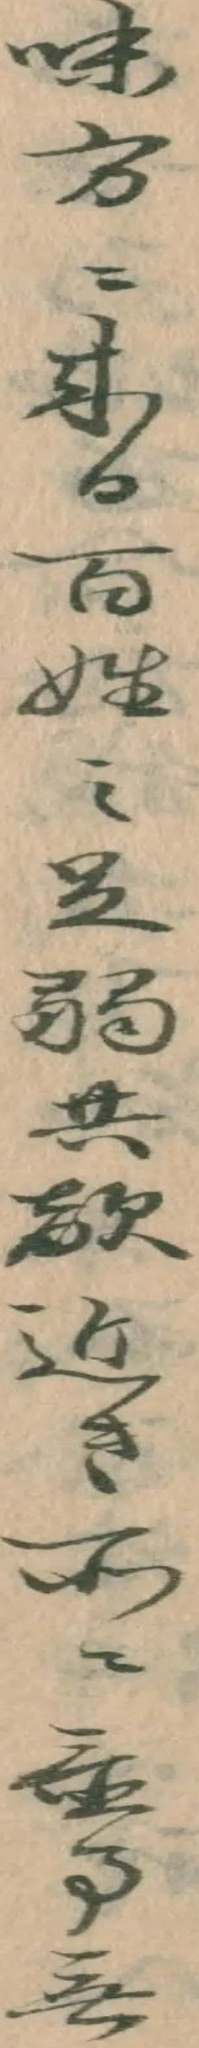味方に来る百姓之足弱共敵近き所に置事無
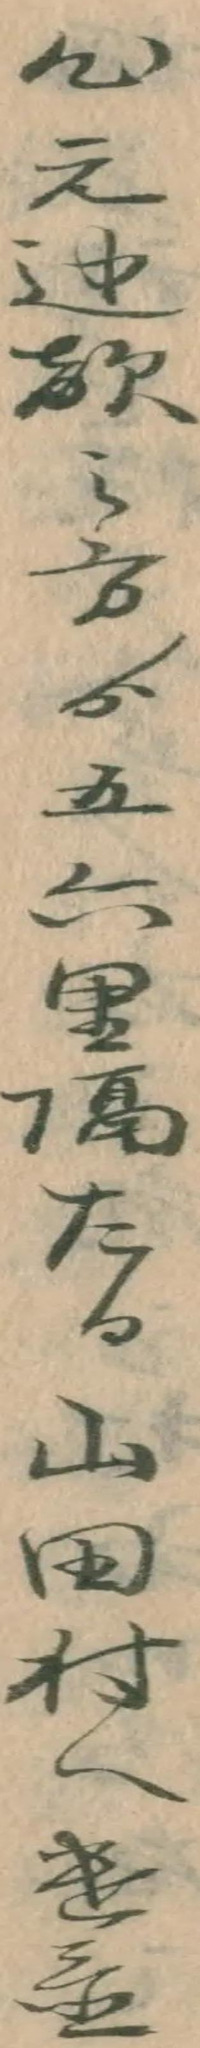心元迚敵之方ゟ五六里隔たる山田村へ遣置
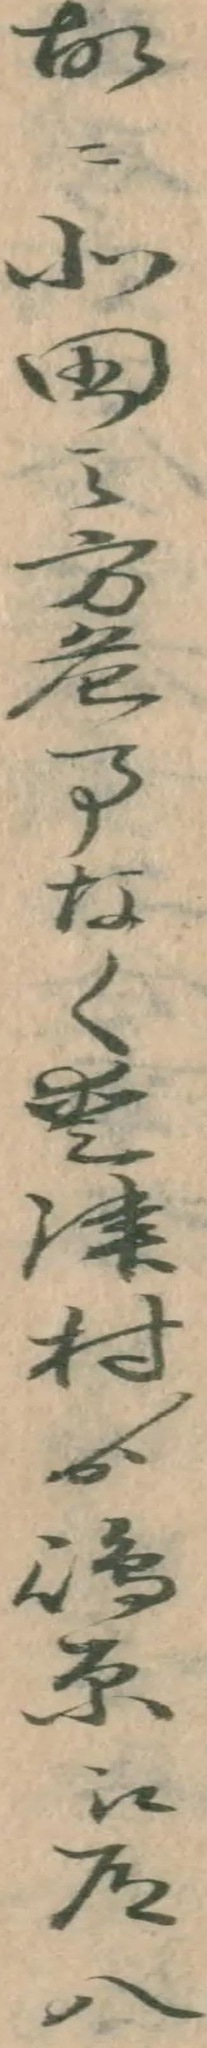故に北田之方危事なく豊津村ゟ島原え道八
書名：切支丹御退治記 49巻. [1]
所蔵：国立国会図書館 National Diet Library, JAPAN
